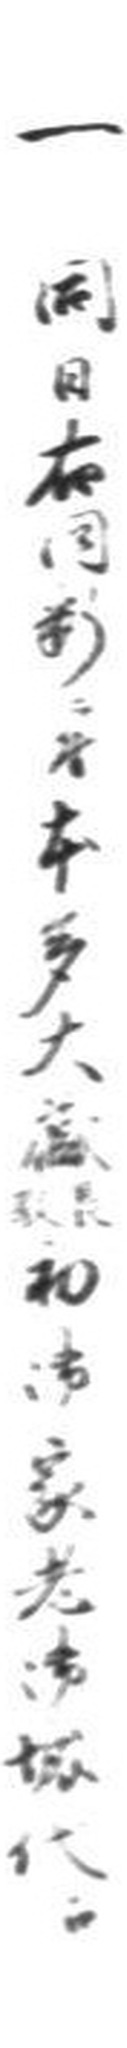一同日右同断ニ付本多大蔵義教初御家老御城代江
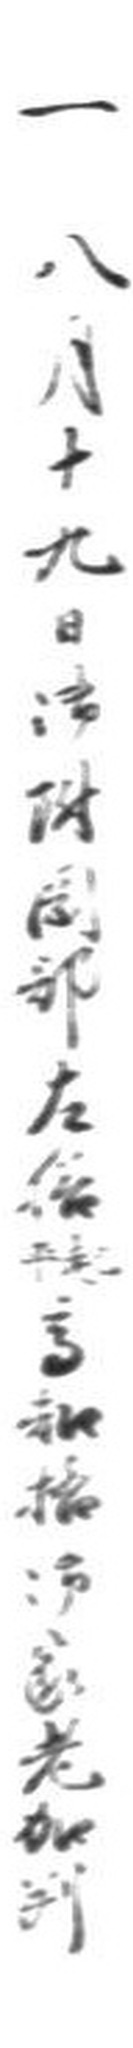一八月十九日御附岡部左膳起平高知格御家老加判
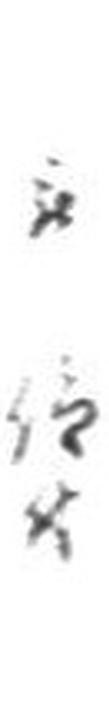被仰付
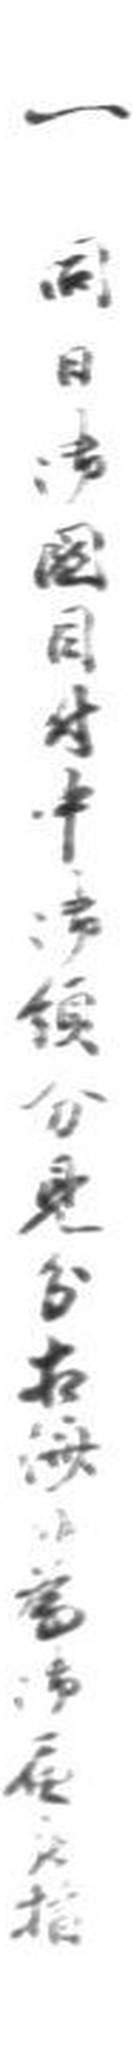一同日御国目付中御領分見分相済候為御届被指
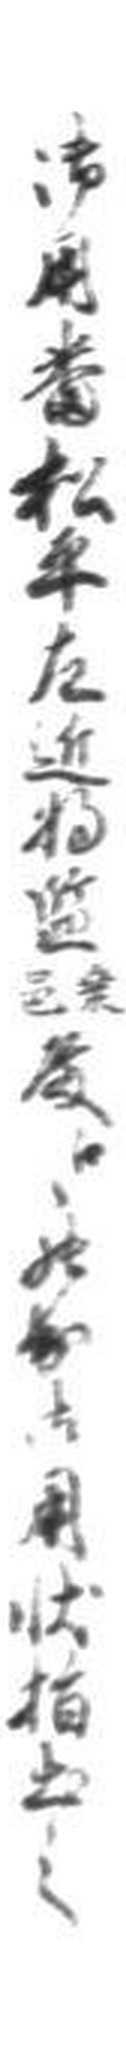御用番松平左近将監乗邑江罷出御用状指出之
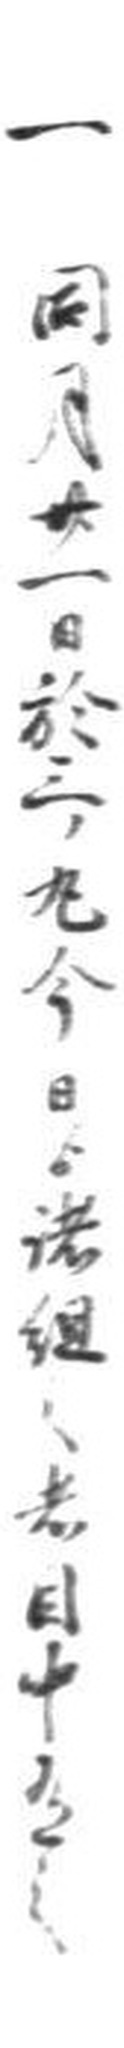一同月廿一日於三ノ丸今日ゟ諸組之者目中有之

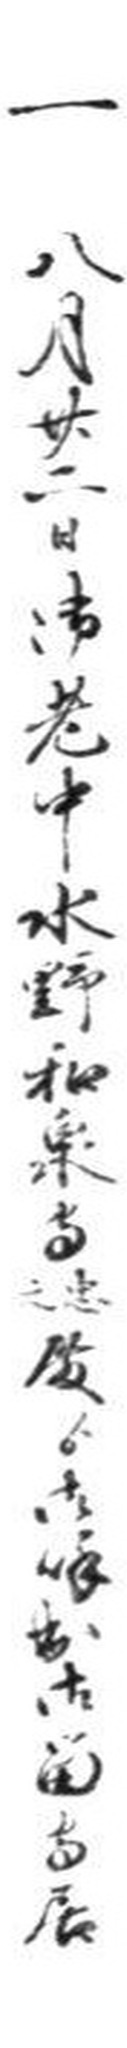一八月廿二日御老中水野和泉守忠之殿ゟ御呼出御留守居
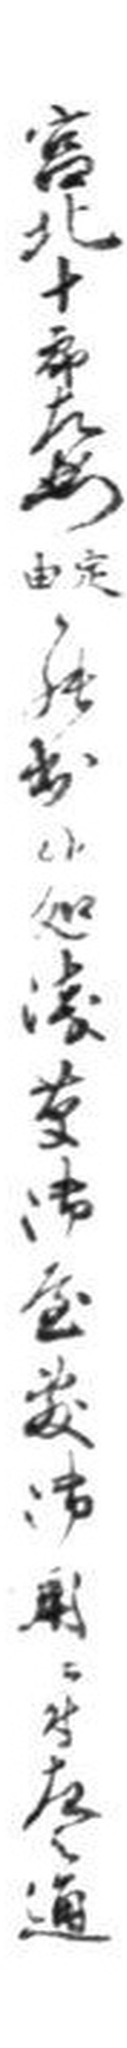宮北十郎左衛門定由罷出候処浅草屋敷御用ニ付左之通
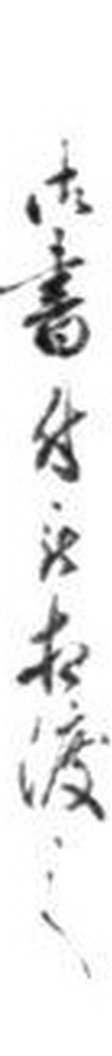御書付被相渡之
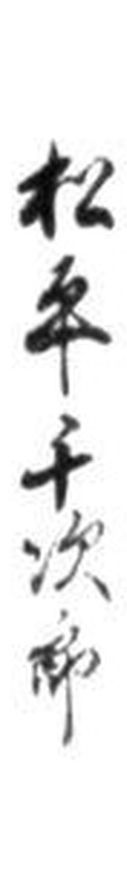松平千次郎
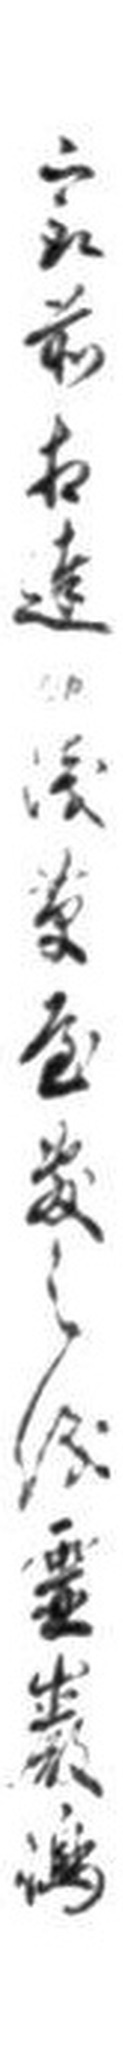最前相達候浅草屋敷之儀霊巌嶋
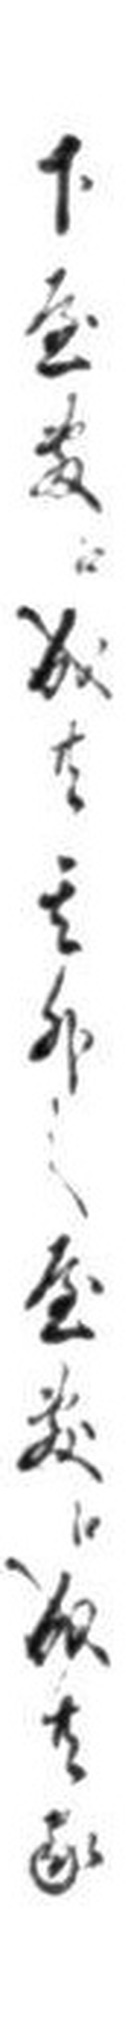下屋敷江成共其外之屋敷江成共家
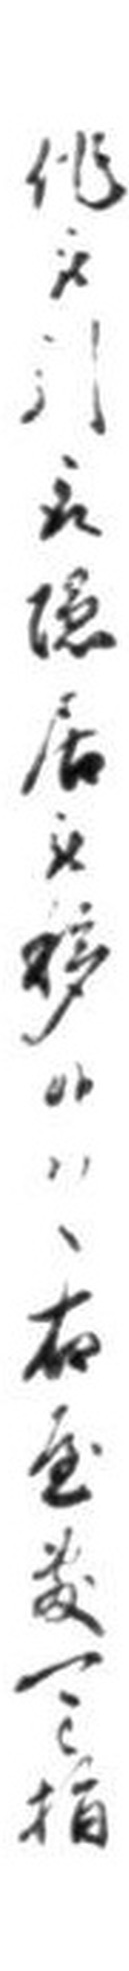作被引取隠居被移候ハヽ右屋敷可被指
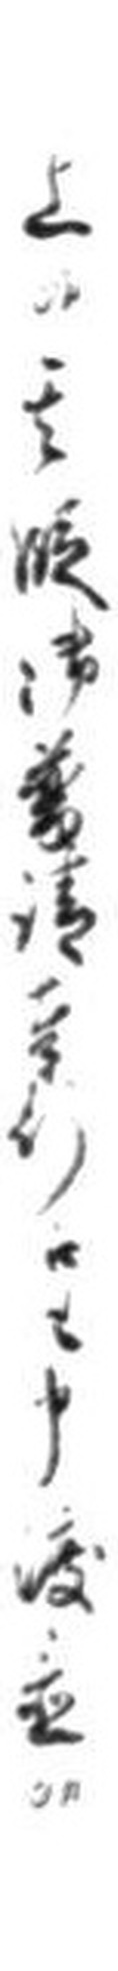上候其段御普請奉行江も申渡置候
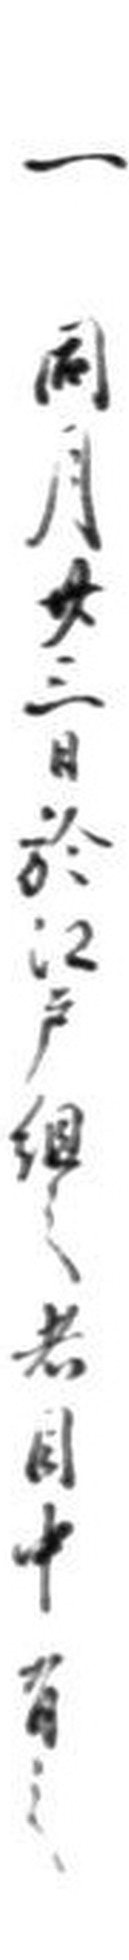一同月廿三日於江戸組之者目中有之
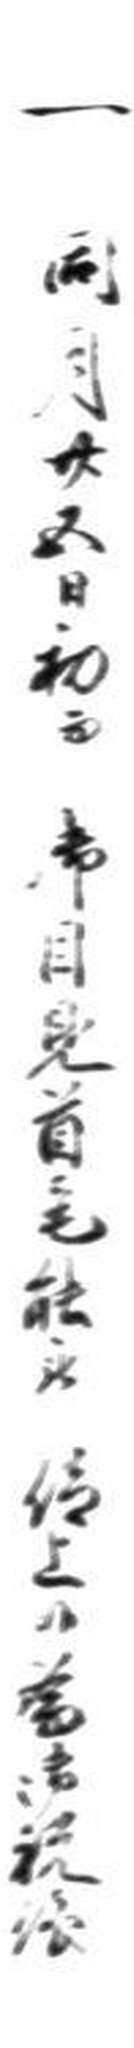一同月廿五日初而御目見首尾能被仰上候為御祝儀
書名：家譜 三十九 宗矩公 享保十年
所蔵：福井県文書館 Fukui Prefectural Archives
